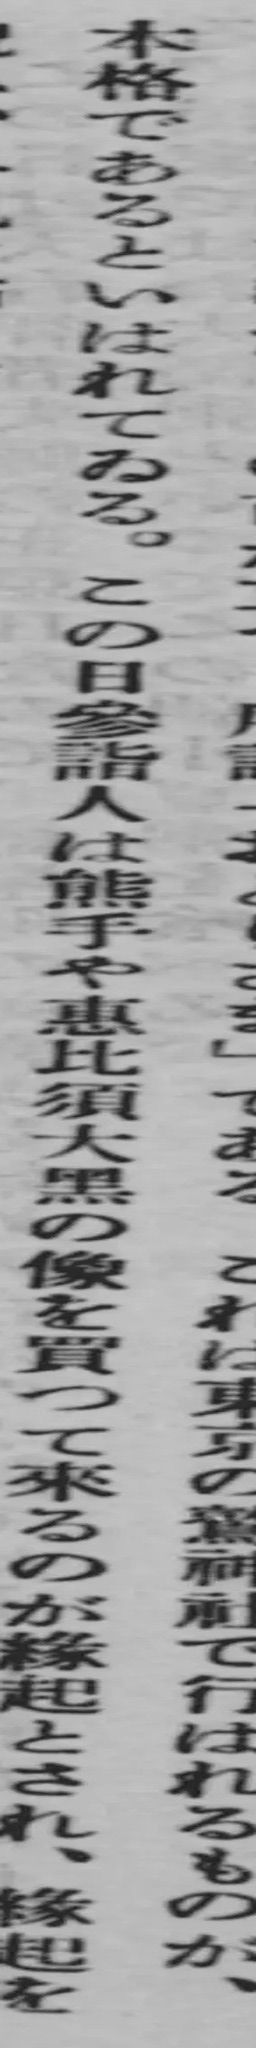本格であるといはれてゐる。この日參詣人は熊手や惠比須大黑の像を買つて來るのが緣起とされ、緣起を
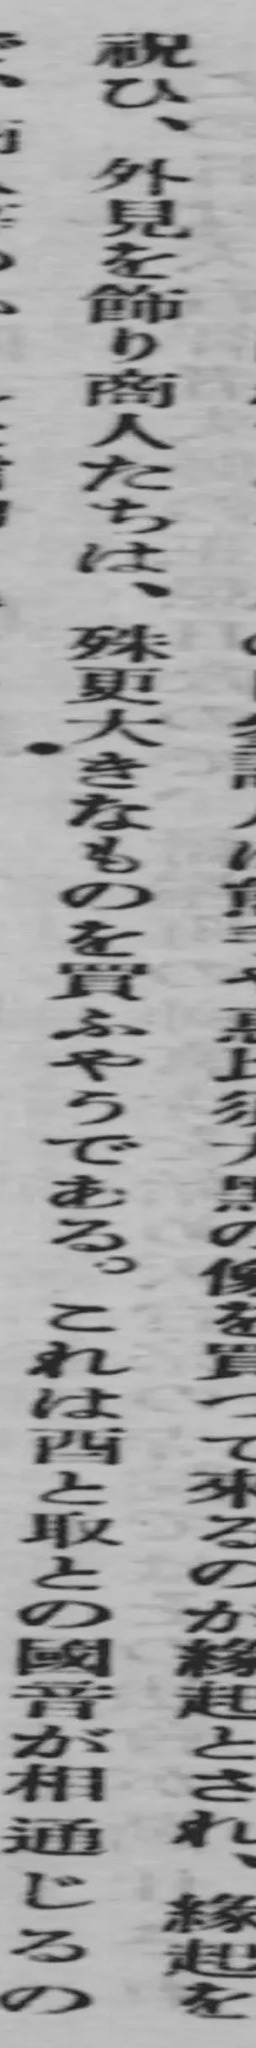祝ひ、外見を飾り商人たちは、殊更大きなものを買ふやうである。これは酉と取との國音が相通じるの
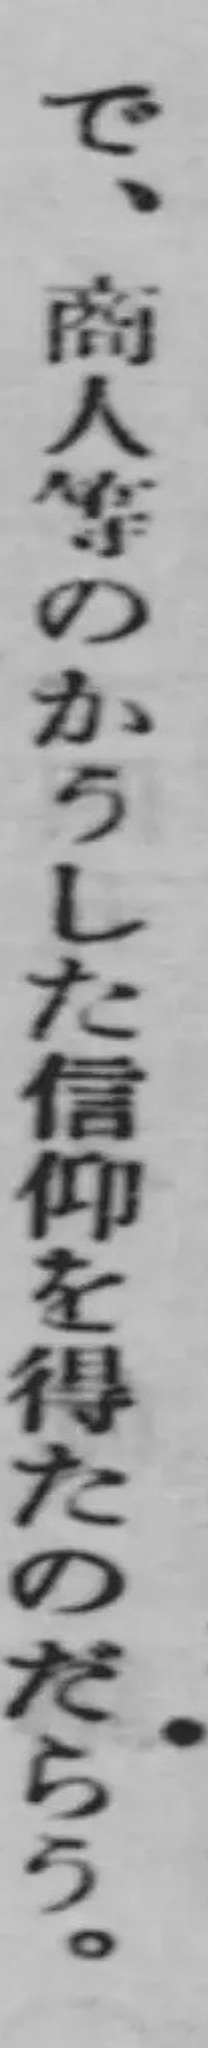で、商人等のかうした信仰を得たのだらう。
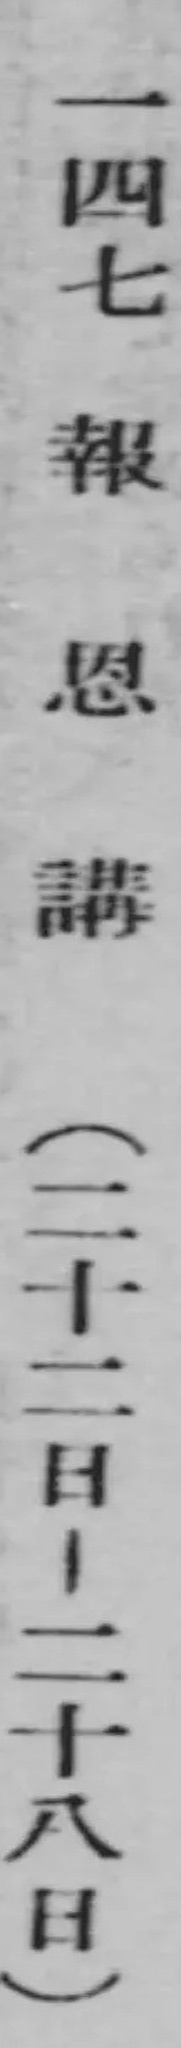一四七報恩講(二十二日－二十八日)
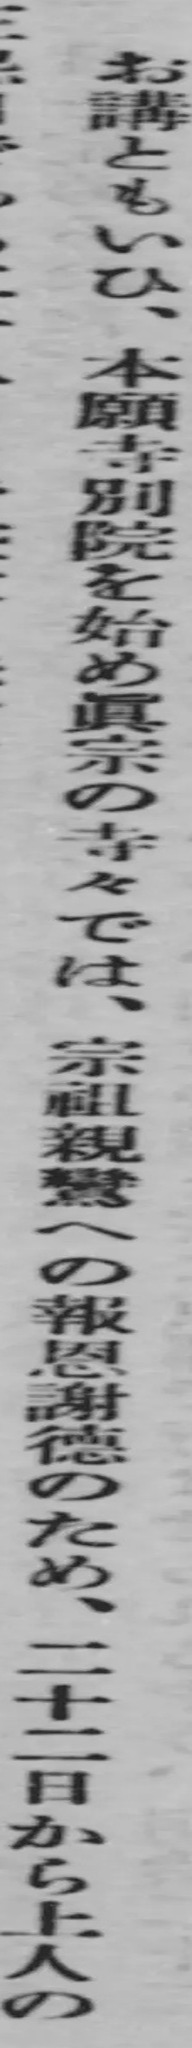お講ともいひ、本願寺別院を始め眞宗の寺々では、宗祖親鸞への報恩謝德のため、二十二日から上人の
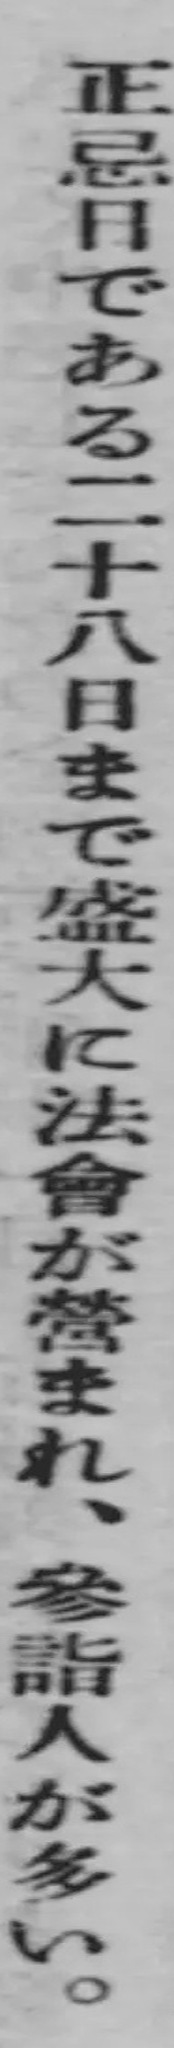正忌日である二十八日まで盛大に法會が營まれ、參詣人が多い。
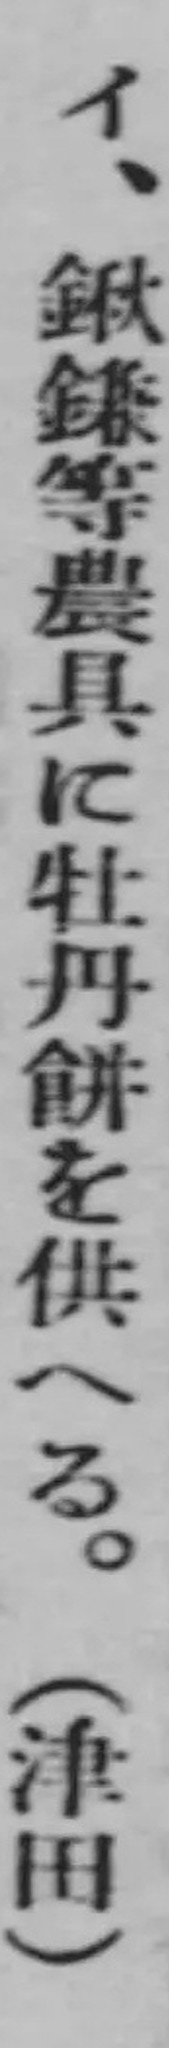イ、鍬鎌等農具に牡丹餅を供へる。(津田)
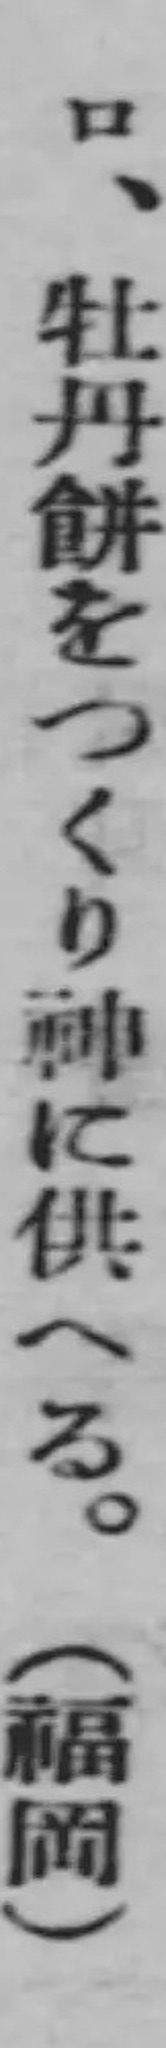ロ、牡丹餅をつくり神に供へる。(福岡)
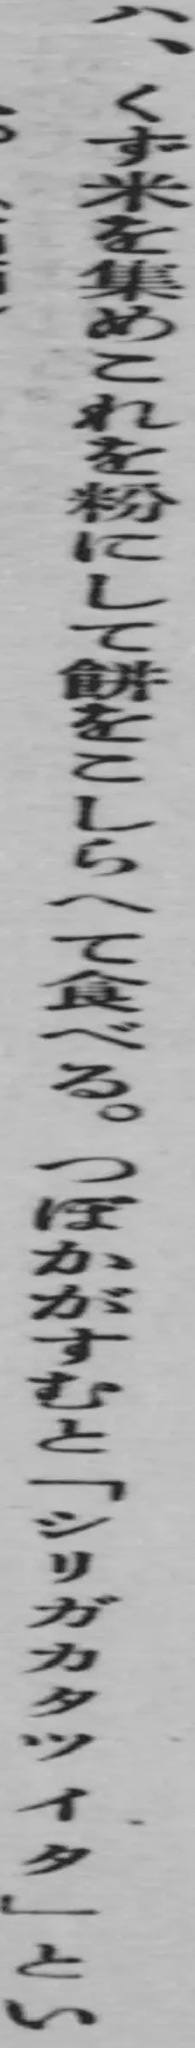ハ、くず米を集めこれを粉にして餅をこしらへて食べる。つぼかがすむと「シリガカタツイタ」とい
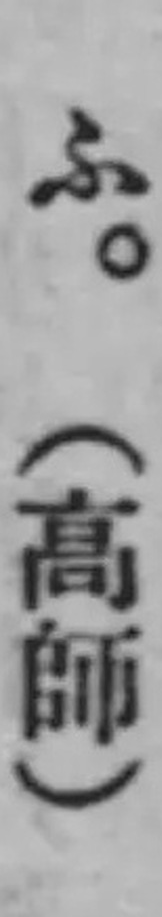ふ。(高師)
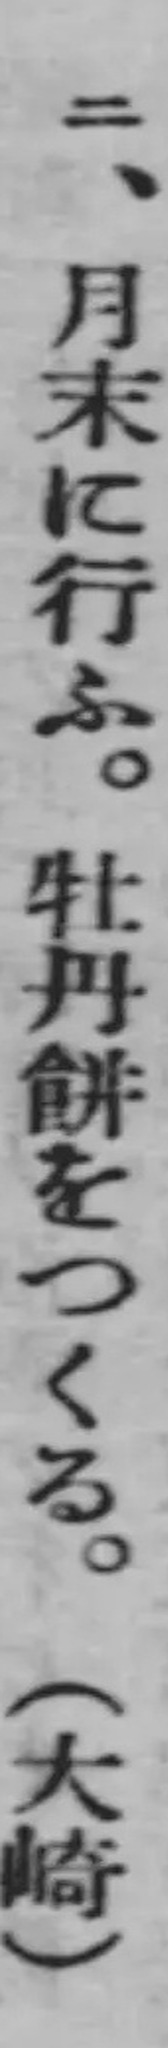ニ、月末に行ふ。牡丹餅をつくる。(大崎)
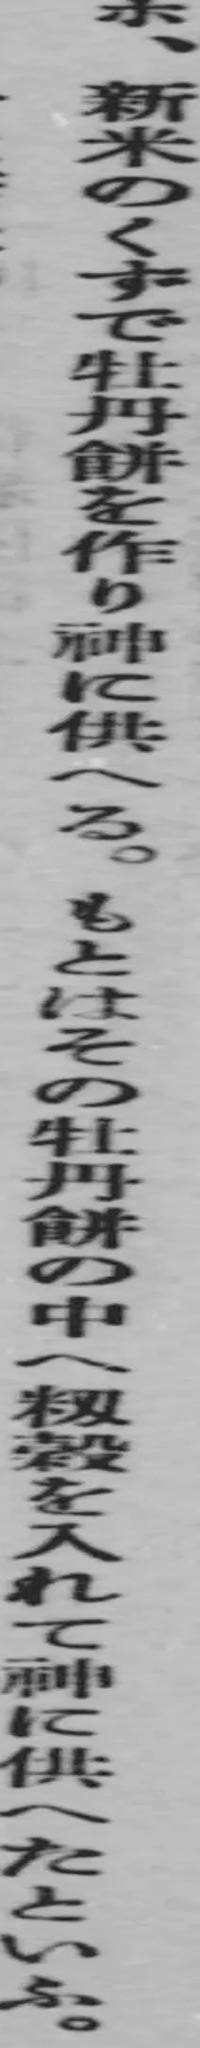ホ、新米のくずで牡丹餅を作り神に供へる。もとはその牡丹餅の中へ籾穀を入れて神に供へたといふ。
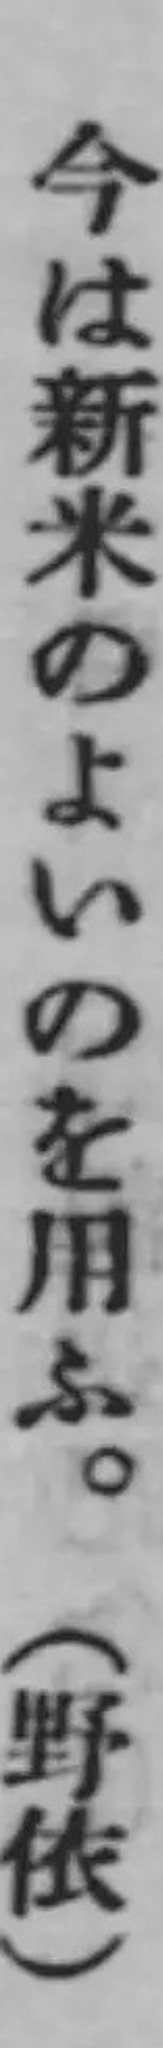今は新米のよいのを用ふ。(野依)
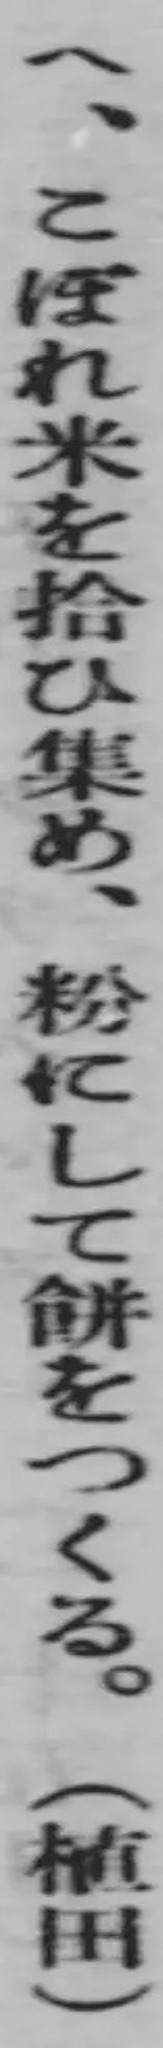ヘ、こぼれ米を拾ひ集め、粉にして餅をつくる。(植田)
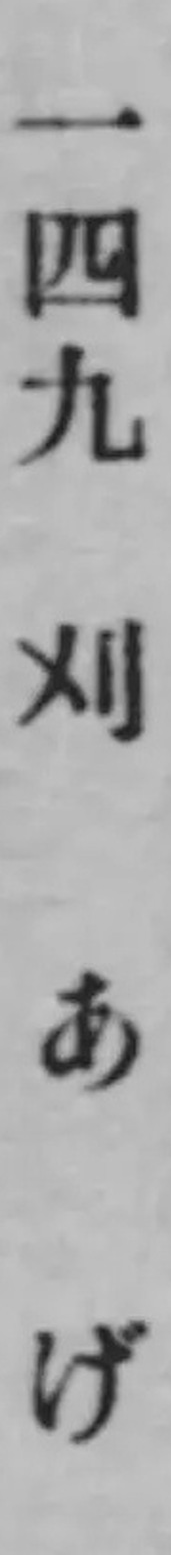一四九刈あげ
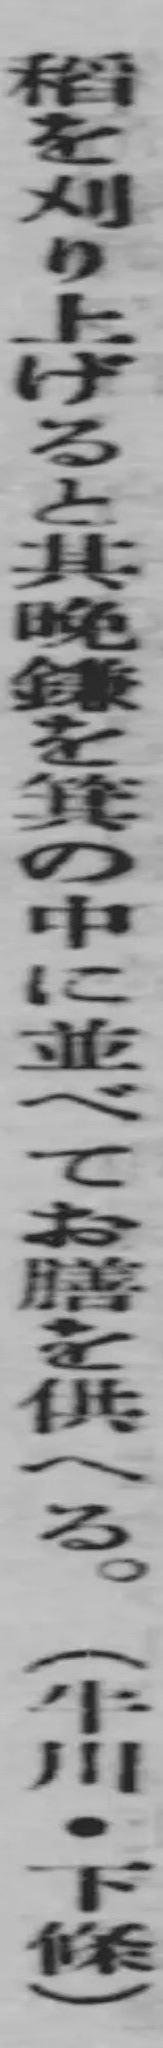稻を刈り上げると其晩鎌を箕の中に並べてお膳を供へる。(牛川・下條)
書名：豊橋の年中行事
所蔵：国立国会図書館 National Diet Library, JAPAN
